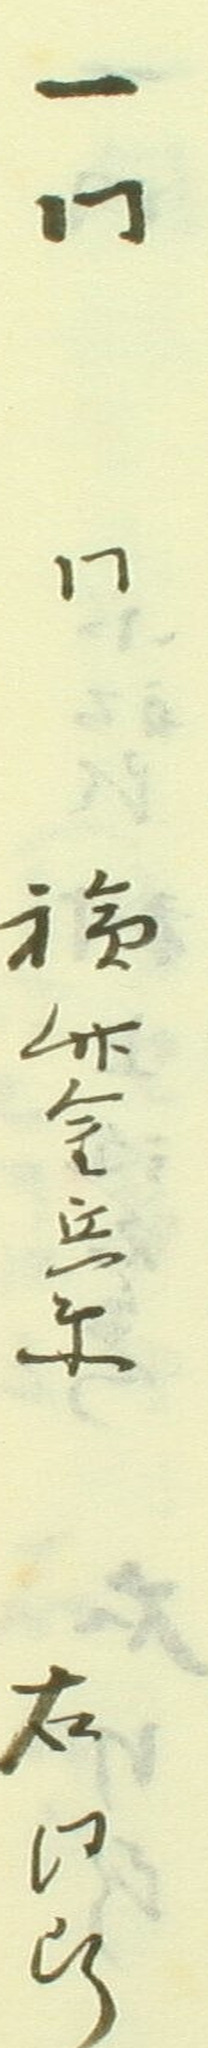一同同福竹金兵衛右同断
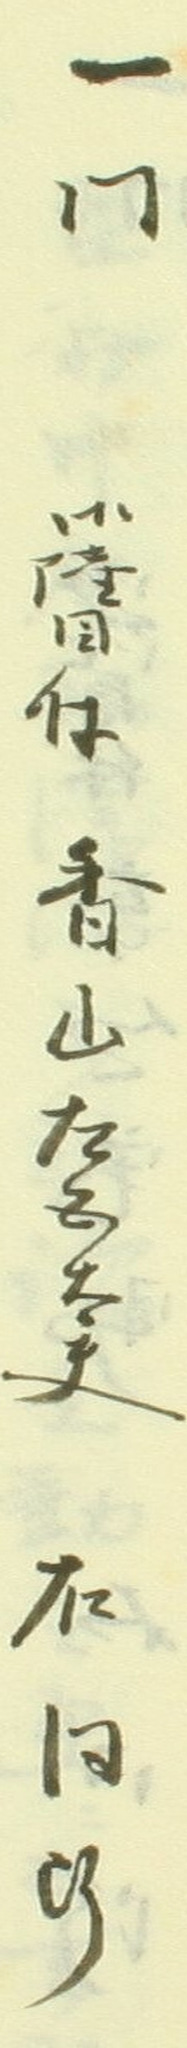一同御陸目付香山左五太夫右同断
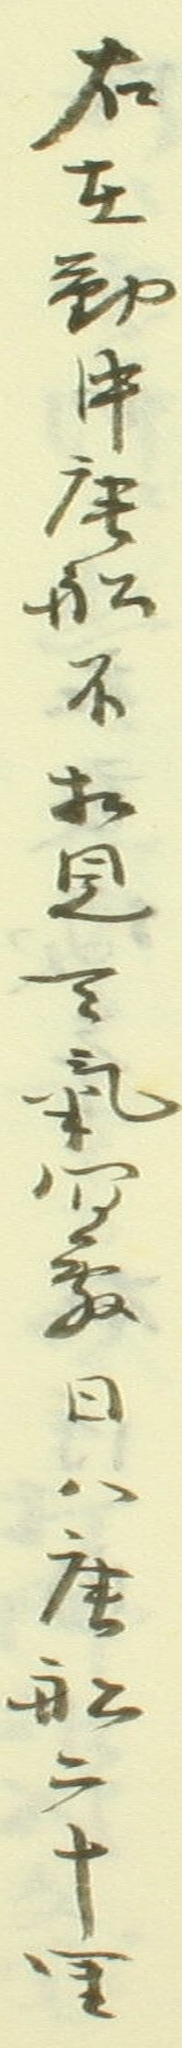右在勤中唐船不相見天気宜敷日は唐船二十里
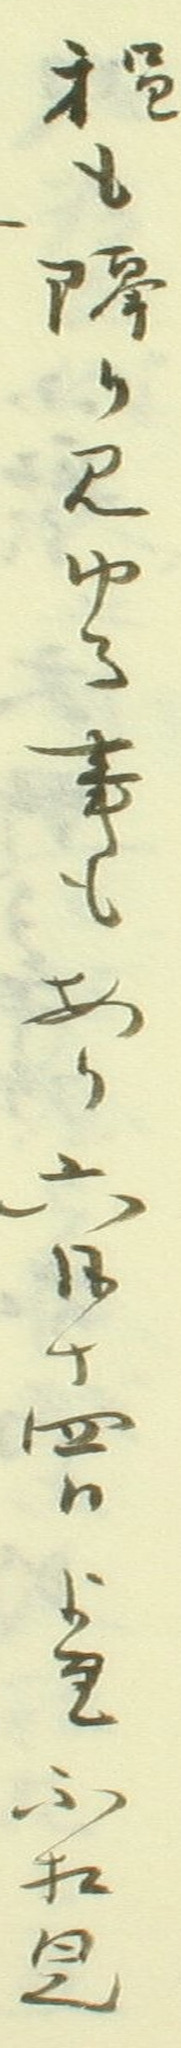程も隔り見ゆる事もあり六月十四日より不相見
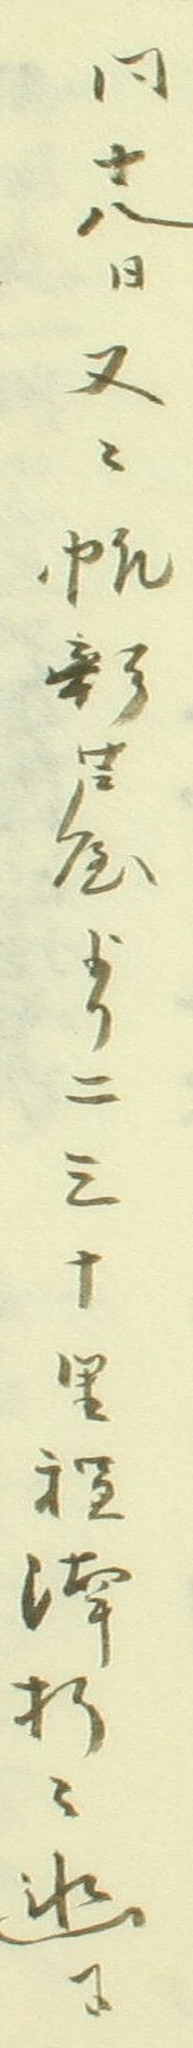同十八日又又帆彩芦屋より二三十里程滞折々沖に
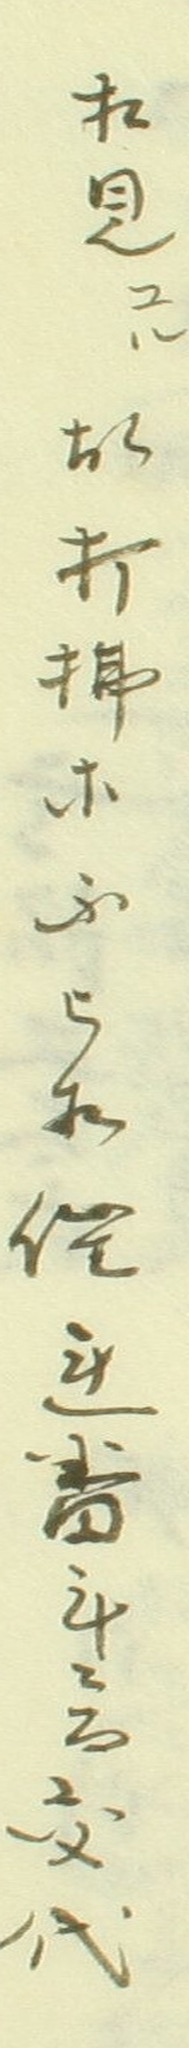相見ゆる故打払等不被相催連番斗に而交代
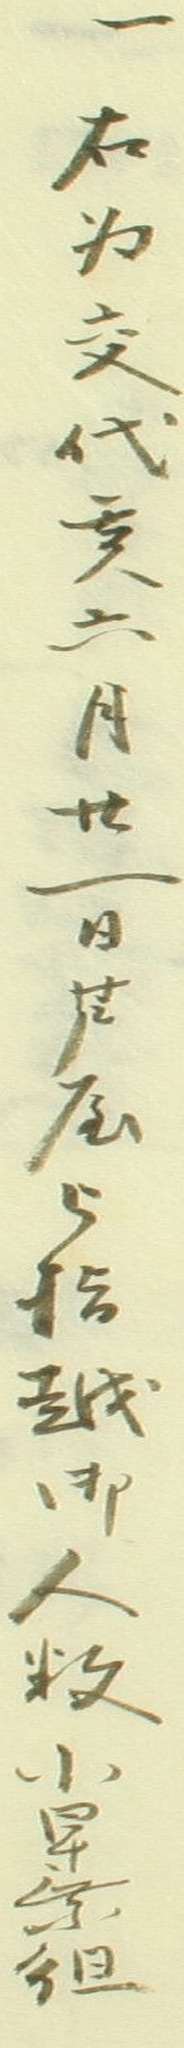一右為交代亥六月廿一日芦屋被指越御人数小早乗組
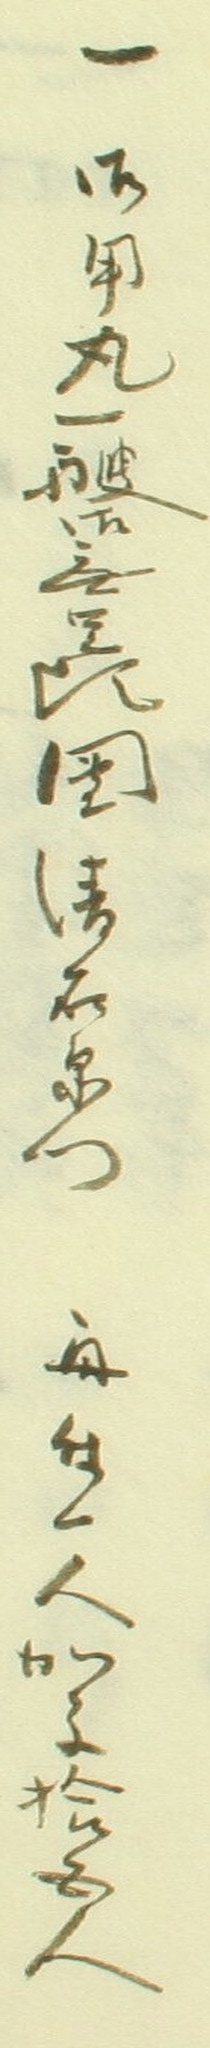一御用丸一艘御無足頭団清右衛門舟付一人加子拾五人
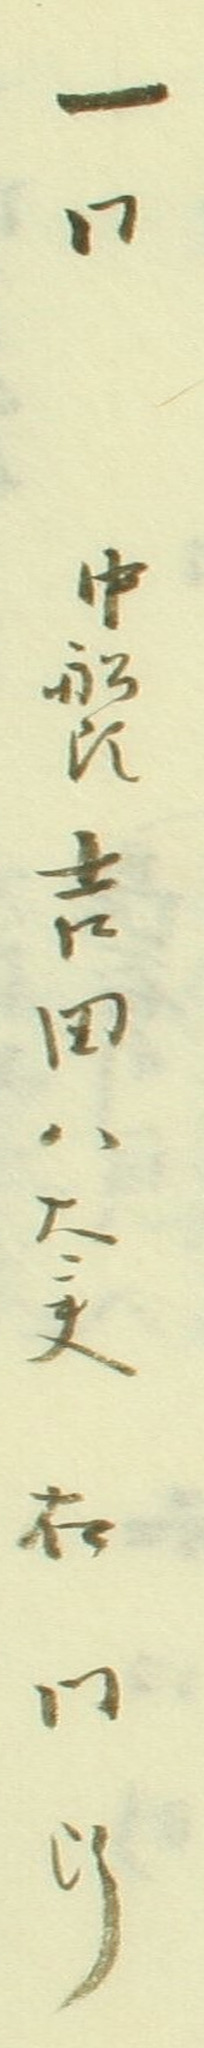一同中船頭吉田八大夫右同断
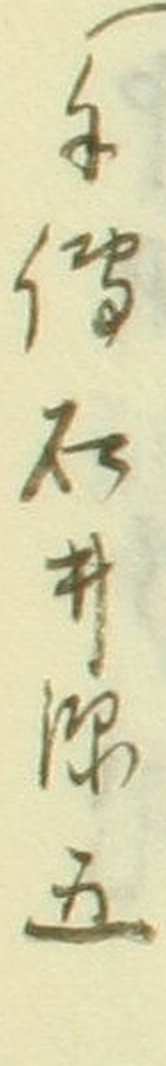手伝石井源五

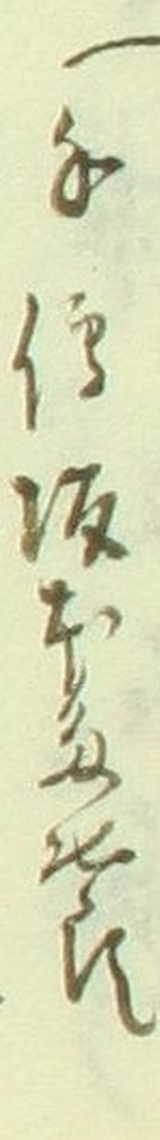手伝坂本多次郎
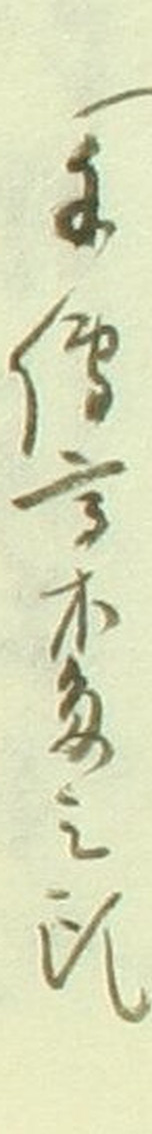手伝高木多三郎
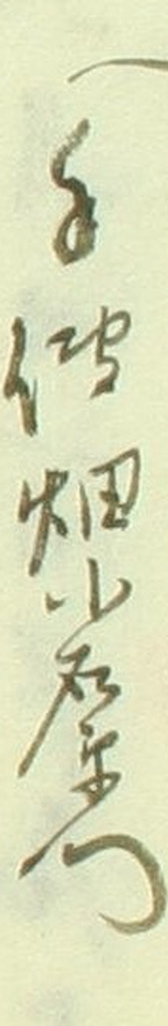手伝畑小右衛門
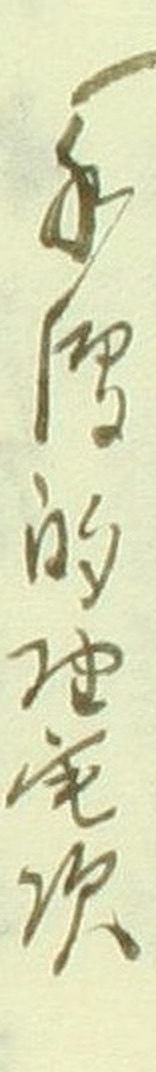手伝的野宅次
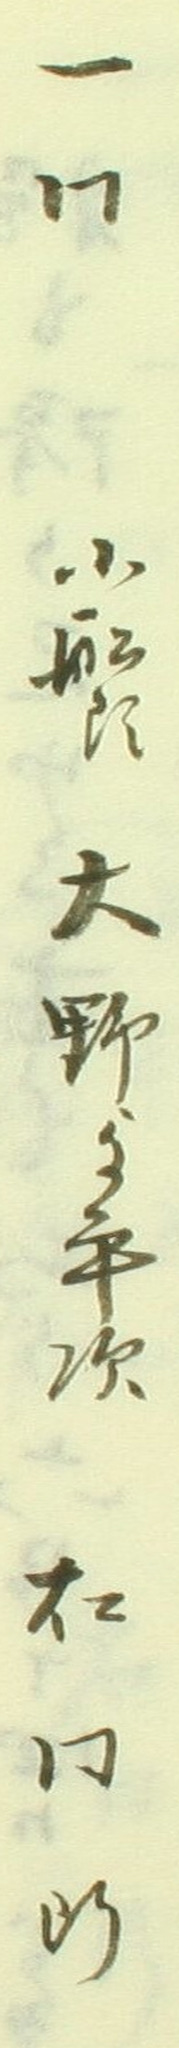一同小船頭大野与平次右同断
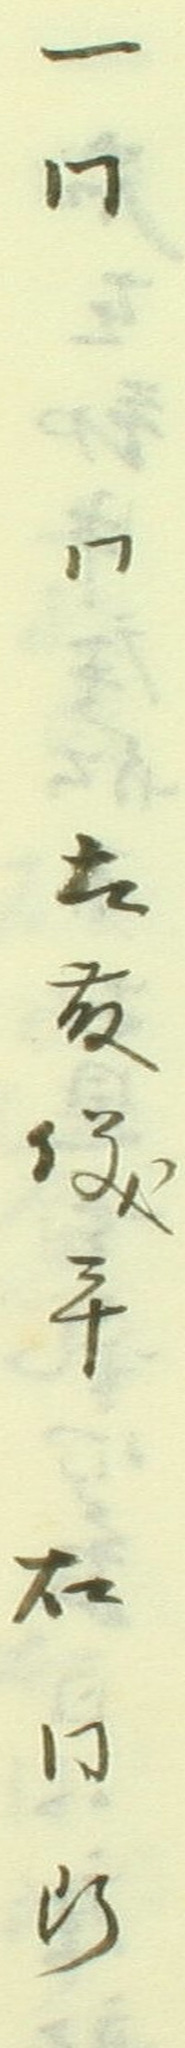一同同帆足門平右同断
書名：唐船漂流記 三
